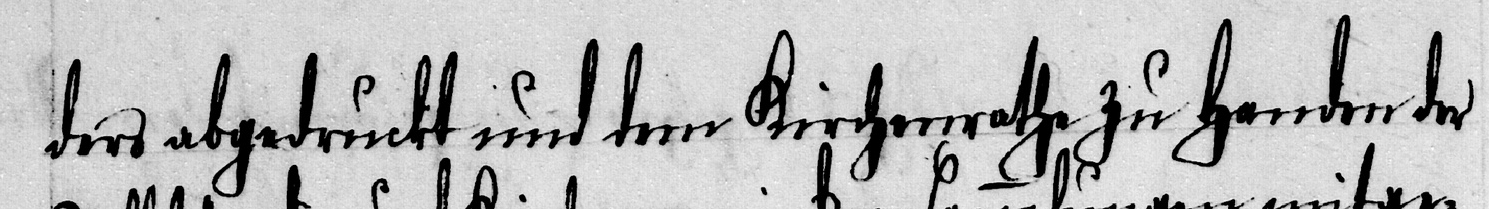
ders abgedruckt und dem Kirchenrathe zu Handen der
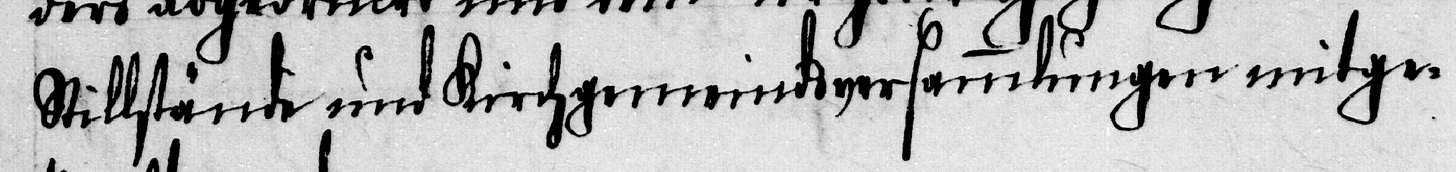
Stillstände und Kirchgemeindsversammlungen mitge¬
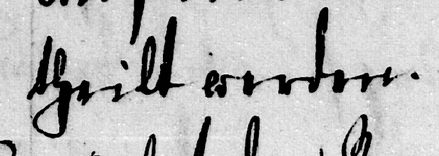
theilt werden.
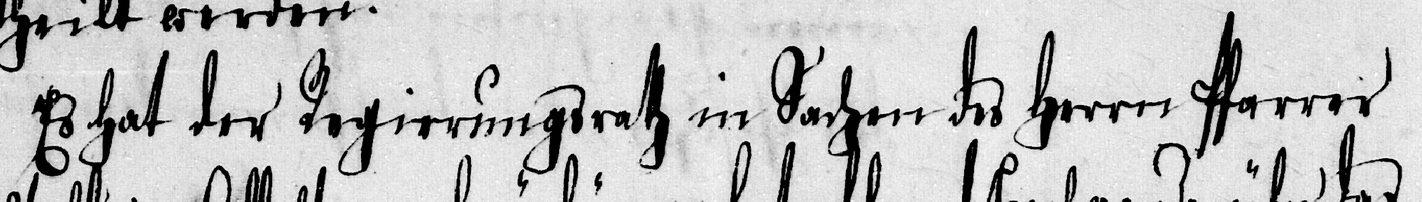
Es hat der Regierungsrath in Sachen des Herrn Pfarrer
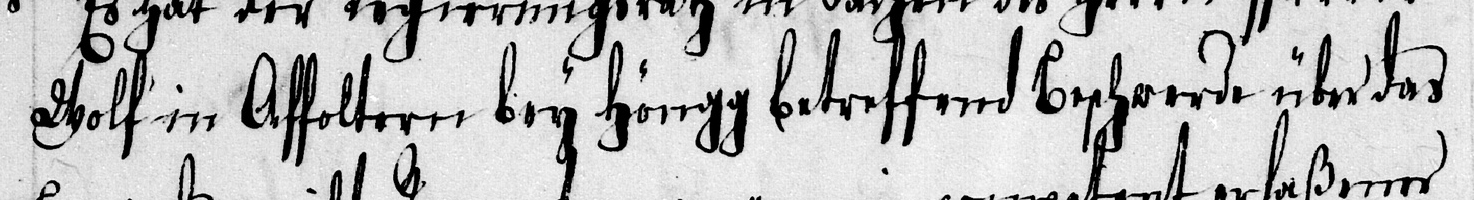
Wolf in Affoltern bey Höngg betreffend Beschwerde über das
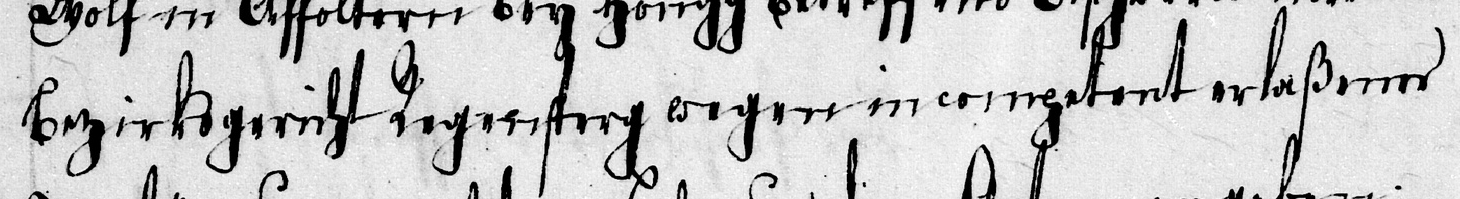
Bezirksgericht Regensperg wegen incompetent erlaßener
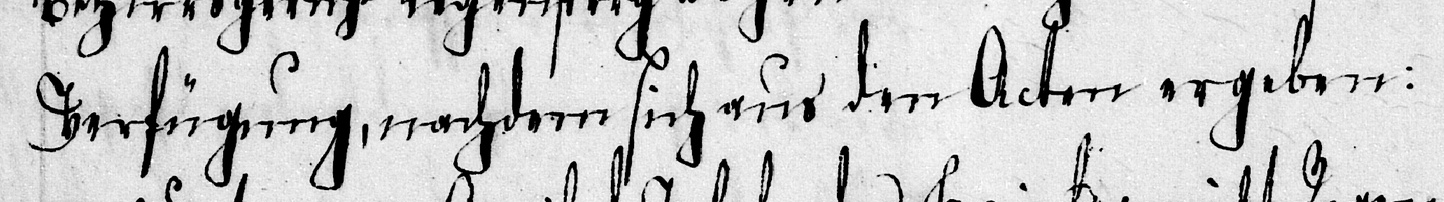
Verfügung, nachdem sich aus den Acten ergeben:
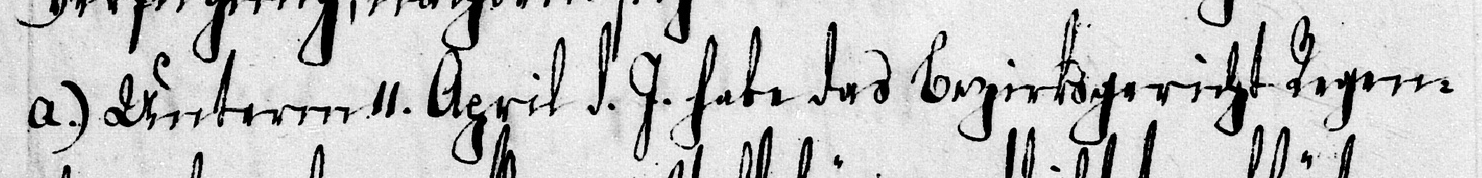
a.) Unterm 11. April d. J. habe das Bezirksgericht Regen¬
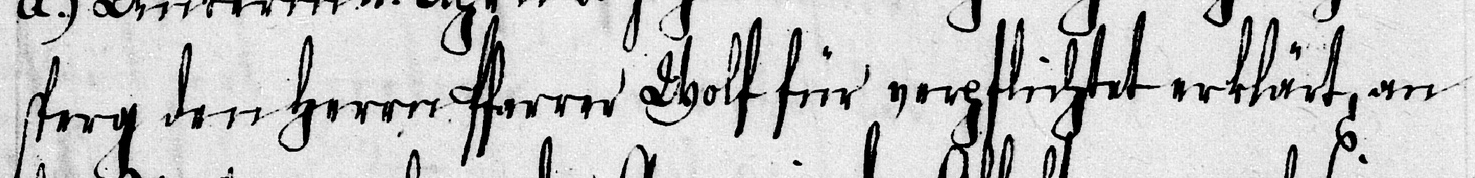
sperg den Herren Pfarrer Wolf für verpflichtet erklärt, an
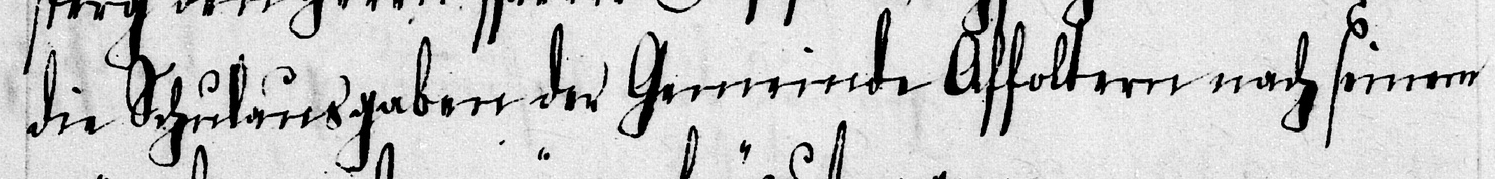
die Schulausgaben der Gemeinde Affoltern nach seinem
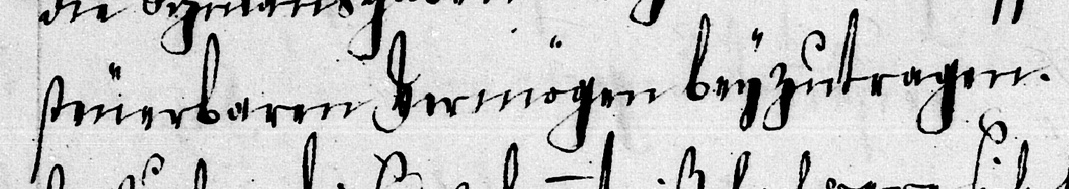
steuerbaren Vermögen beyzutragen.
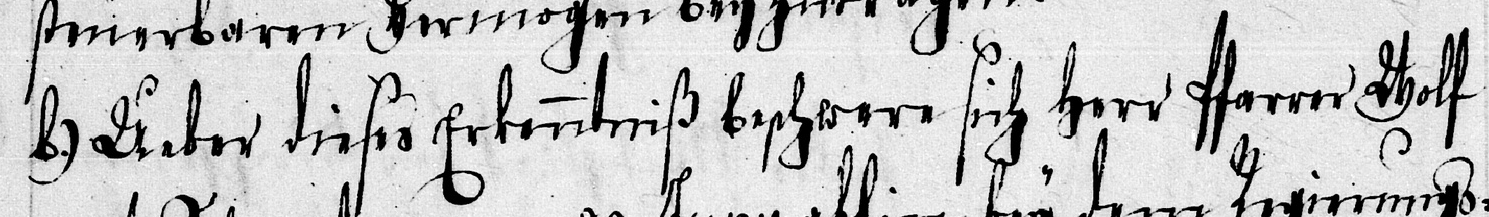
b.) Ueber dieses Erkenntniß beschwere sich Herr Pfarrer Wolf
